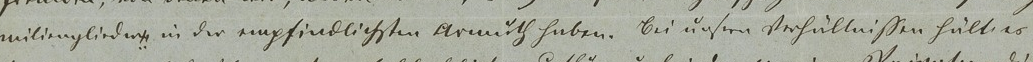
miliengliedern in der empfindlichsten Armuth haben. Bei unsern Verhältnissen hält es
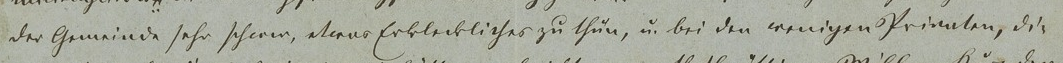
der Gemeinde sehr schwer, etwas Erkleckliches zu thun, u. bei den wenigen Privaten, die
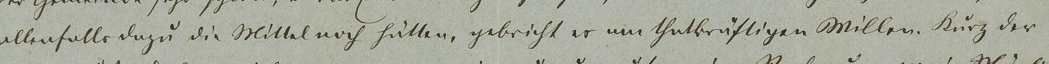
allenfalls dazu die Mittel noch hätten, gebricht es am thatkräftigen Willen. Kurz der
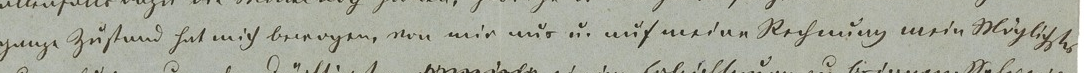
ganze Zustand hat mich bewogen, von mir aus u. auf meine Rechnung mein Möglichstes
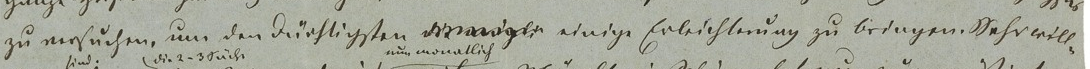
zu versuchen, um den Dürftigsten die mögli einige Erleichterung zu bringen. Sehr will-
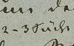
2–3 Säcke
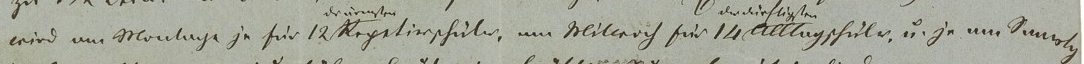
wird am Montage je für 12 der ärmsten Repetierschüler, am Mitwoch für 14 der dürftigsten Alltagschüler, u. je am Samstg
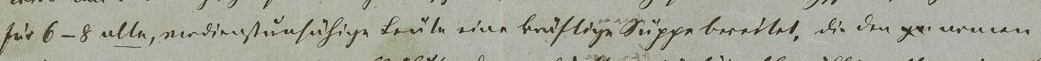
für 6–8 alle, verdienstunfähige Leute eine kräftige Suppe bereitet, die den ga armen
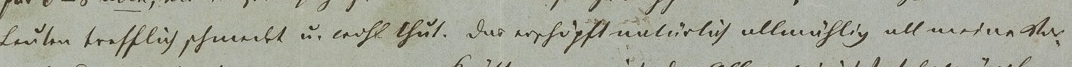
Leuten trefflich schmeckt u. wohl thut. Das erschöpft natürlich allmählig all meine Vor-
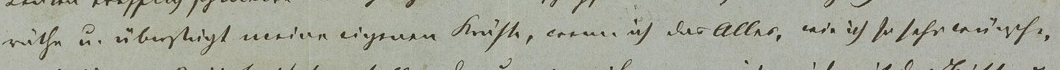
räthe u. übersteigt meine eigenen Kräfte, wenn ich das Alles, wie ich so sehr wünsche,
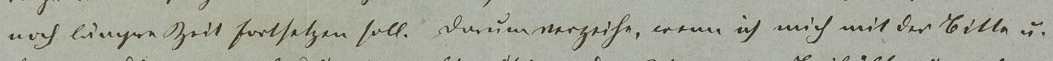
noch längere Zeit fortsetzen soll. Darum verzeihe, wenn ich mich mit der Bitte u.
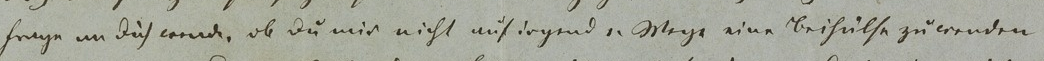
Frage an Dich wende, ob Du mir nicht auf irgend e. Wege eine Beihülfe zuwenden
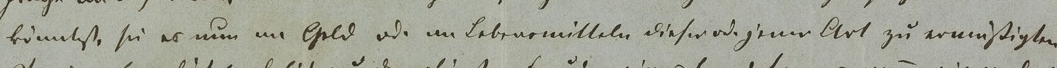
könntest, sei es nun an Geld od. an Lebensmitteln dieser od. jener Art zu ermäßigten
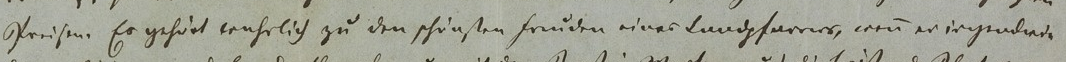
Preisen. Es gehört wahrlich zu den schönsten Freuden eines Landpfarrers, wenn er irgendwie
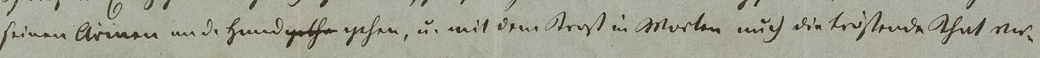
seinen Armen an d. Hand getha gehen, u. mit dem Trost in Worten auch die tröstende That ver-
